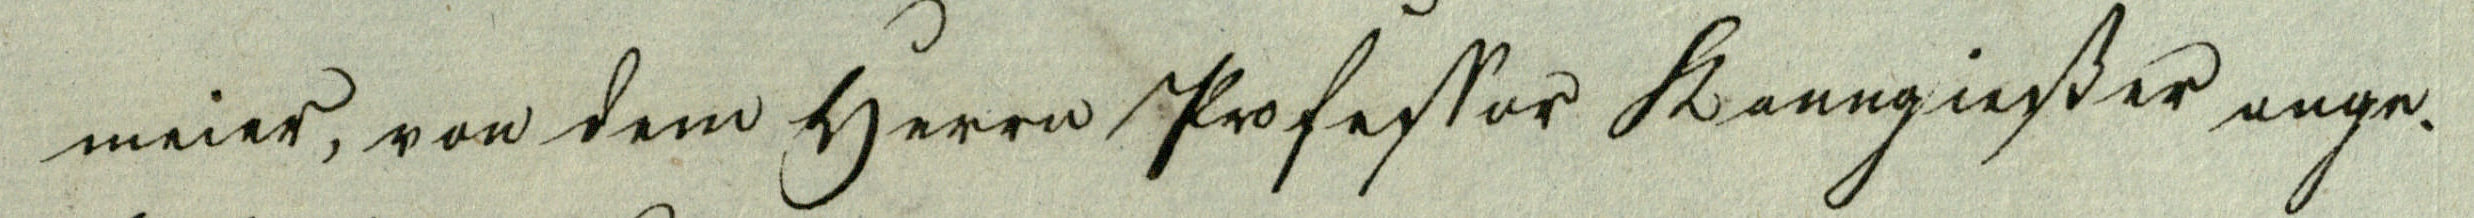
meier, von dem Herrn Professor ange¬
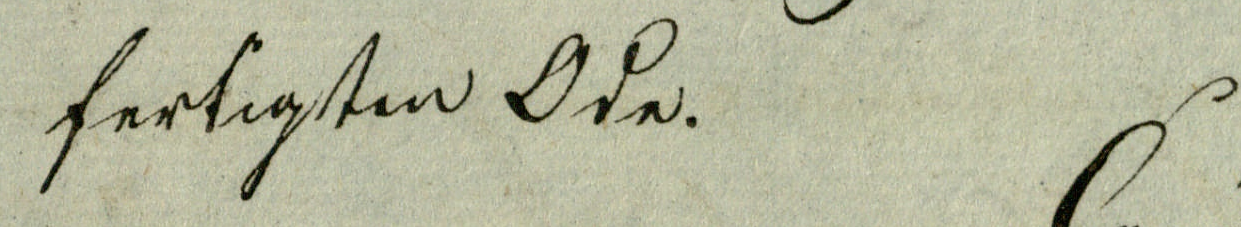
fertigten Ode.
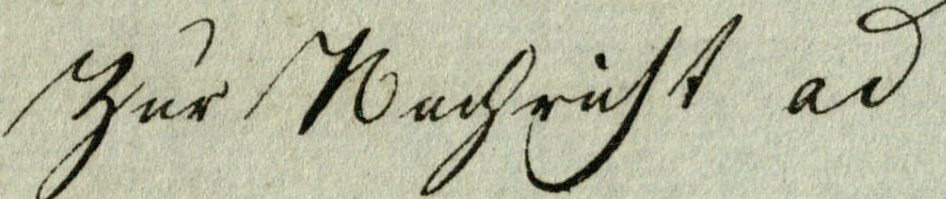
Zur Nachricht ad
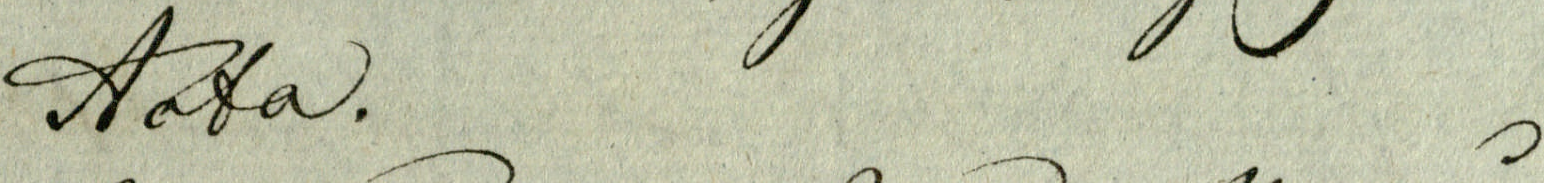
Acta.
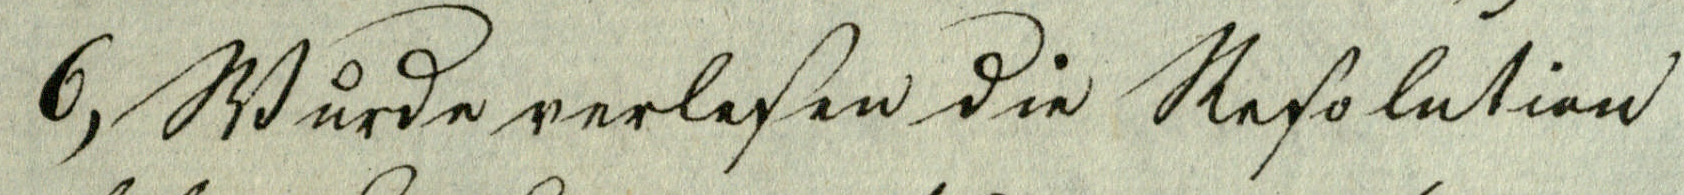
6, Wurde verlesen die Resolution
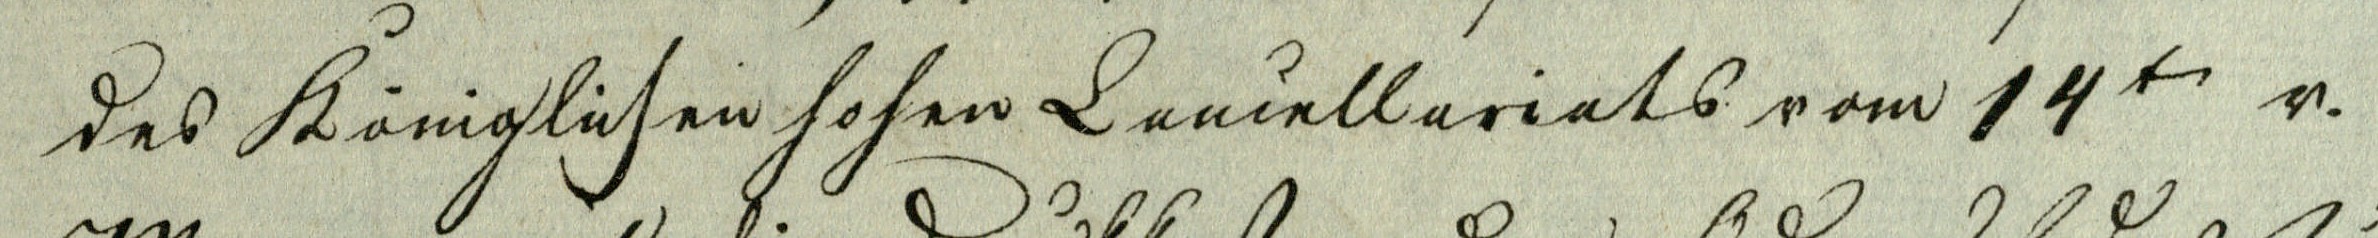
des Königlichen hohen Cancellariats vom 14ten v.
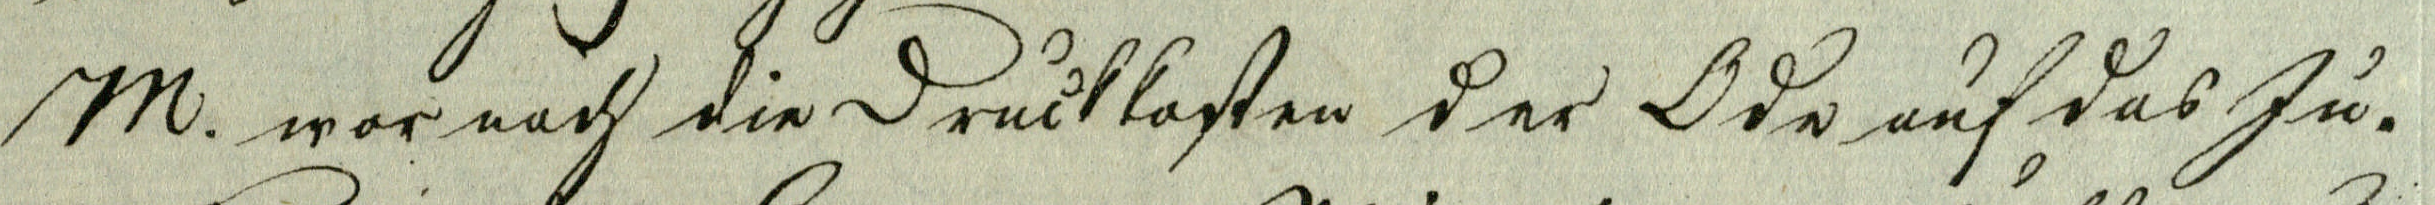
M. wor nach die Druckkosten der Ode auf das Ju¬
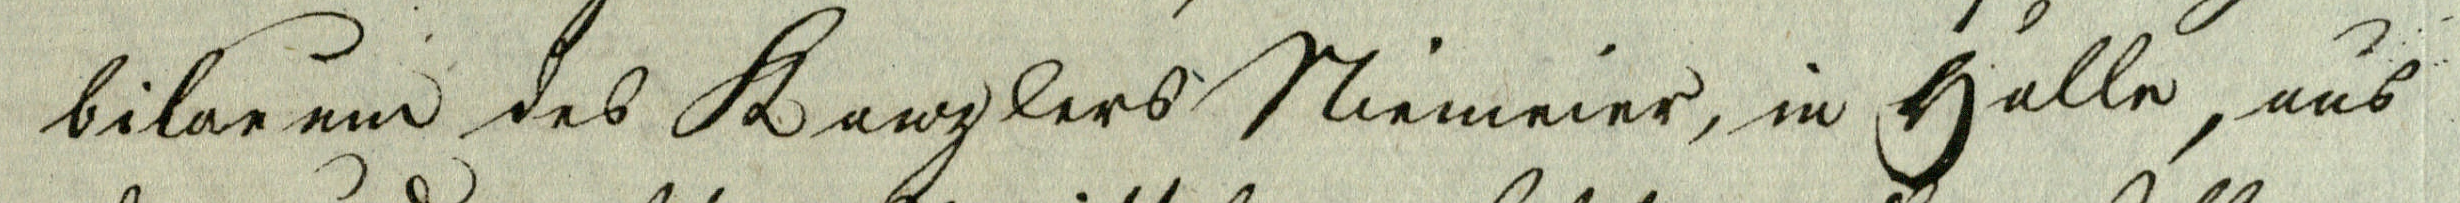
bilaeum des Kanzlers Niemeier, in Halle, aus
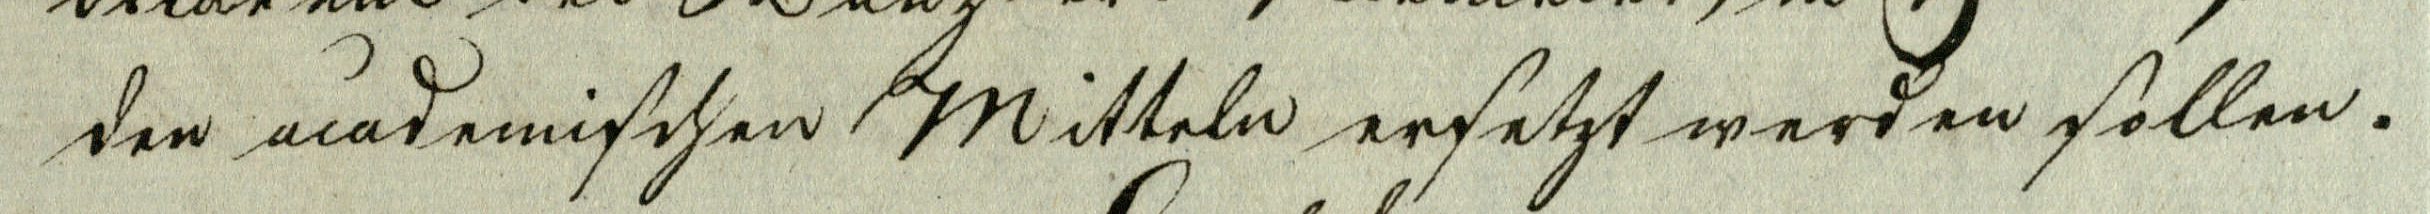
den academischen Mitteln ersetzt werden sollen.
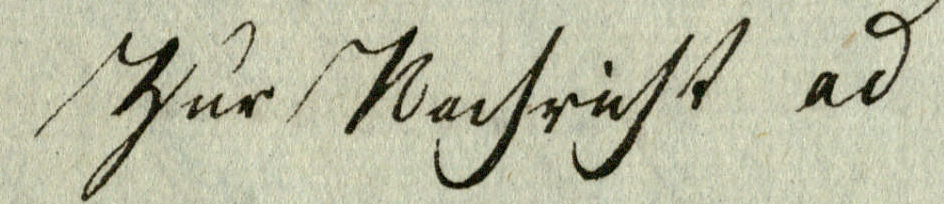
Zur Nachricht ad
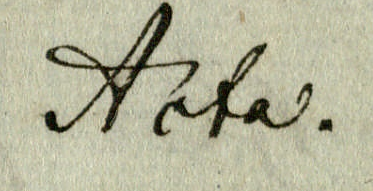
Acta.
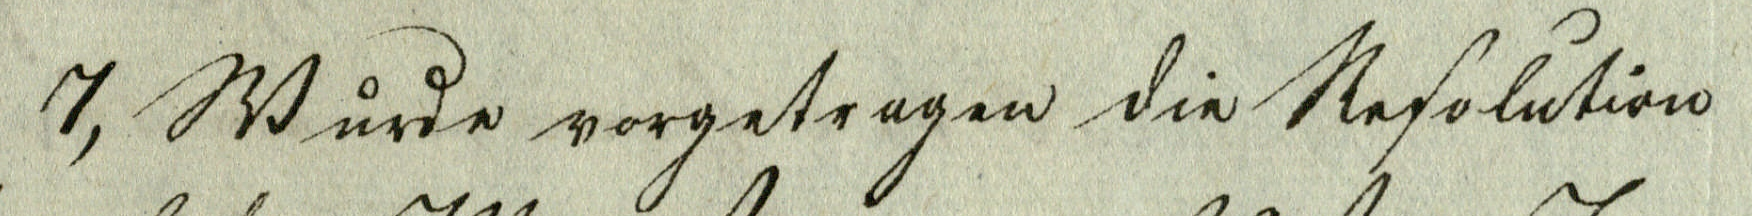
7, Wurde vorgetragen die Resolution
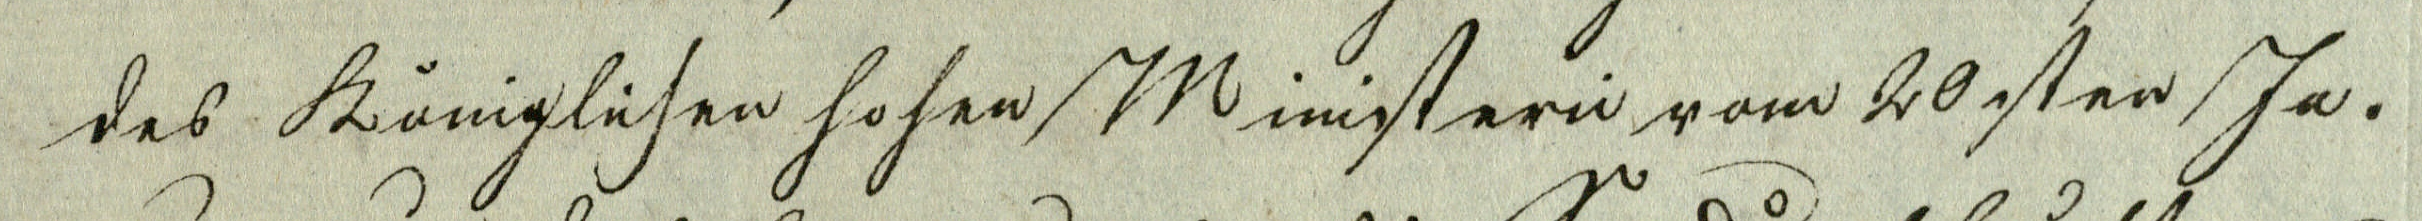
des Königlichen hohen Ministerii vom 20ten Ja¬
